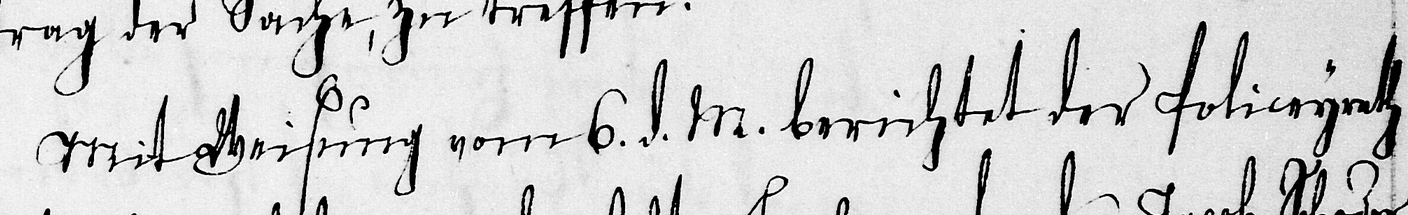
Mit Weisung vom 6. d. M. berichtet der Policeyrath
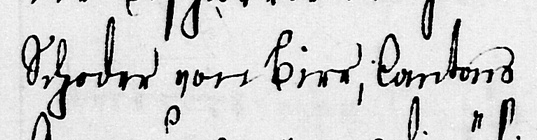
Schoder von Birr, Cantons
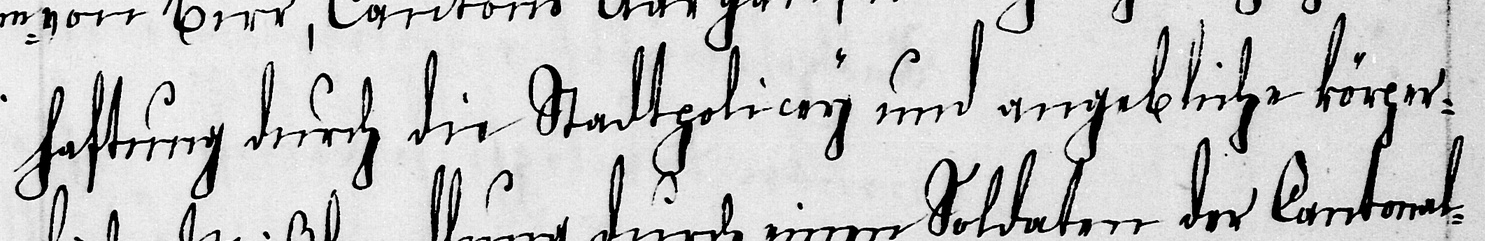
haftung durch die Stadtpolicey und angebliche körper¬
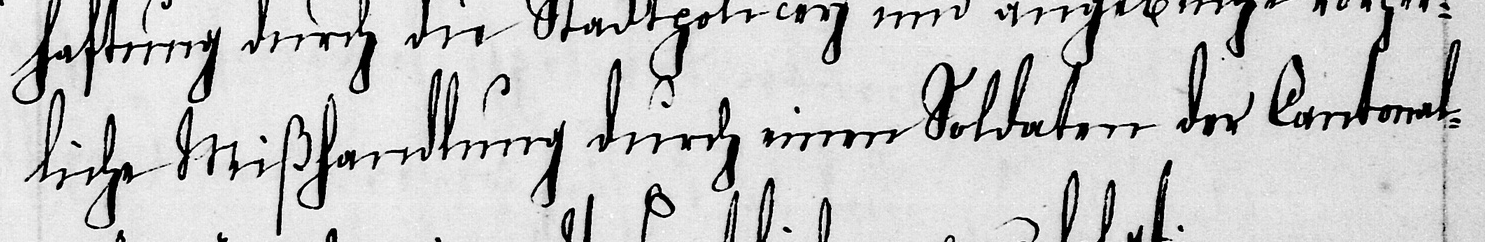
liche Mißhandlung durch einen Soldaten der Cantonal¬
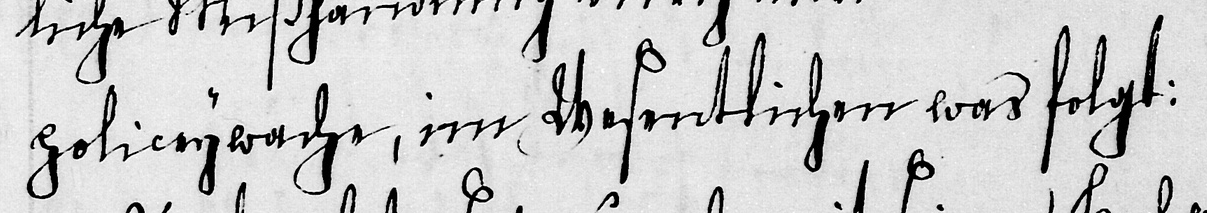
policeywache, im Wesentlichen was folgt:
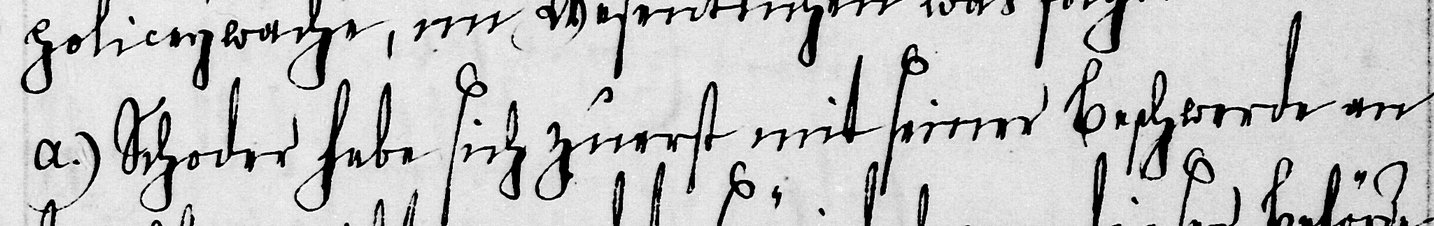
a.) Schoder habe sich zuerst mit seiner Beschwerde an
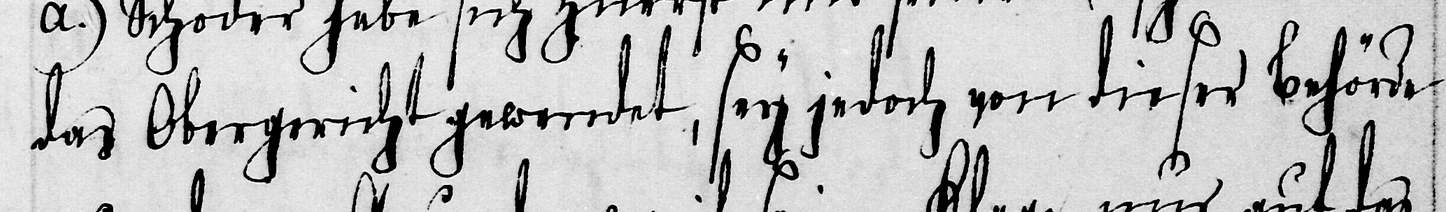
das Obergericht gewendet, sey jedoch von dieser Behörde
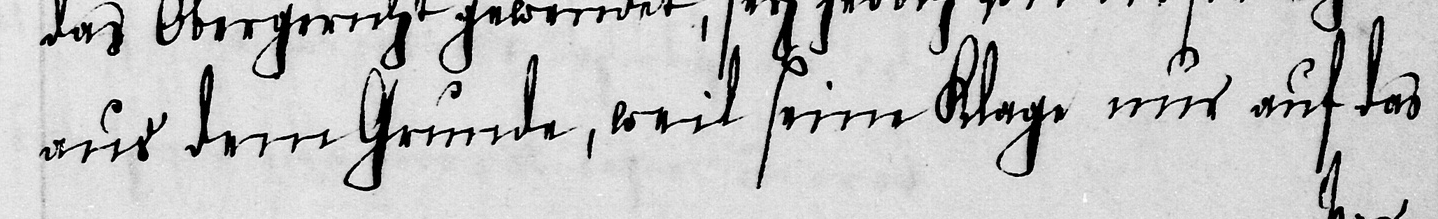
aus dem Grunde, weil seine Klage nur auf das
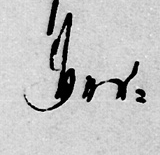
Ver¬
